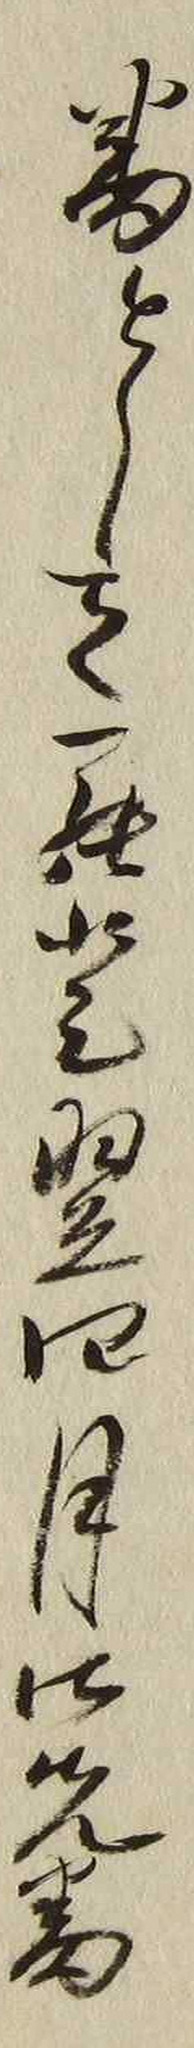番として罷登翌四月御先番
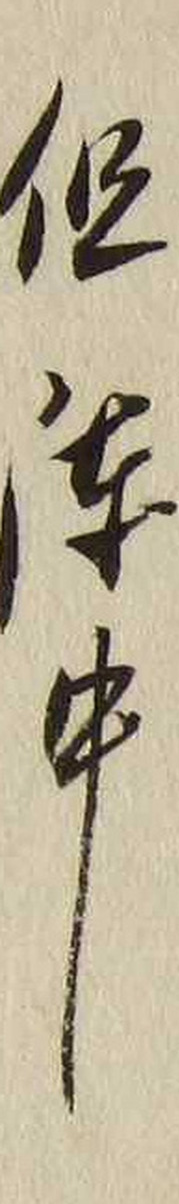但陣中
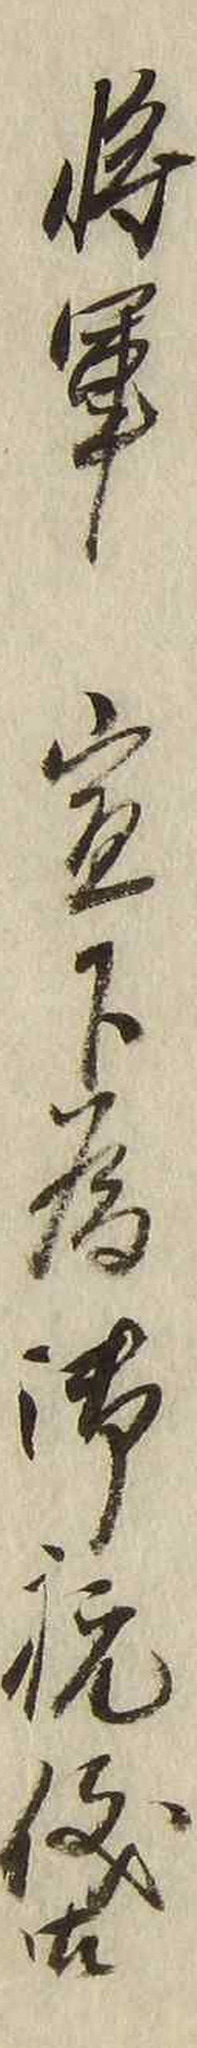将軍宣下為御祝儀御

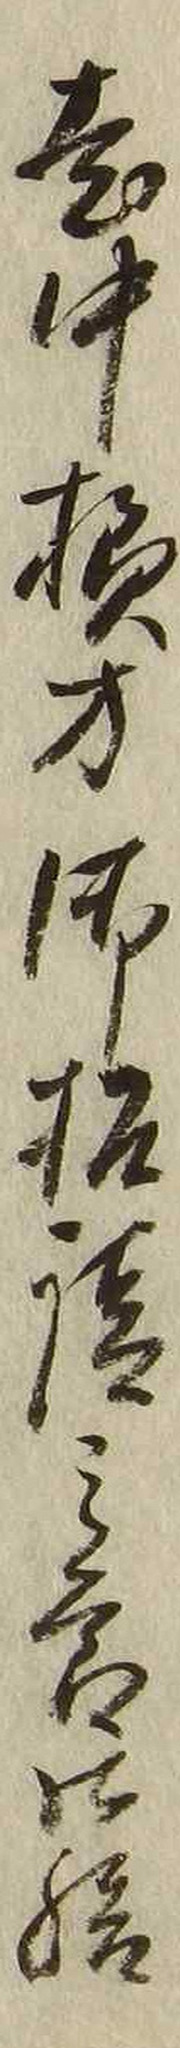老中様方御招請之節御給
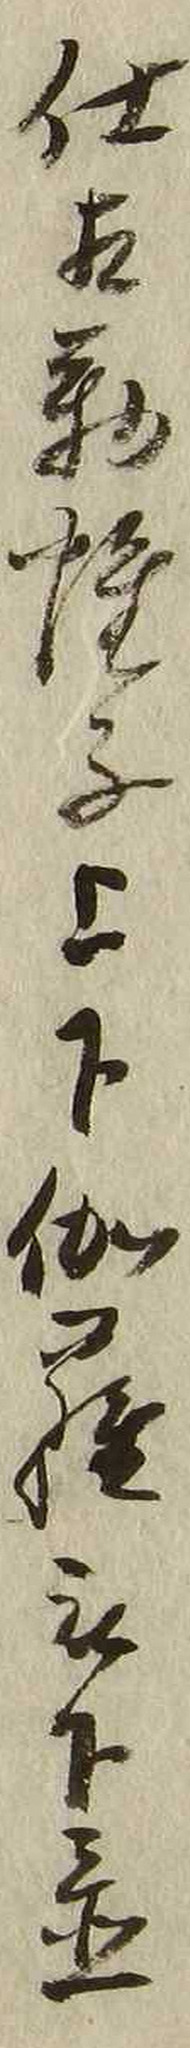仕相勤帷子上下伽羅被下置
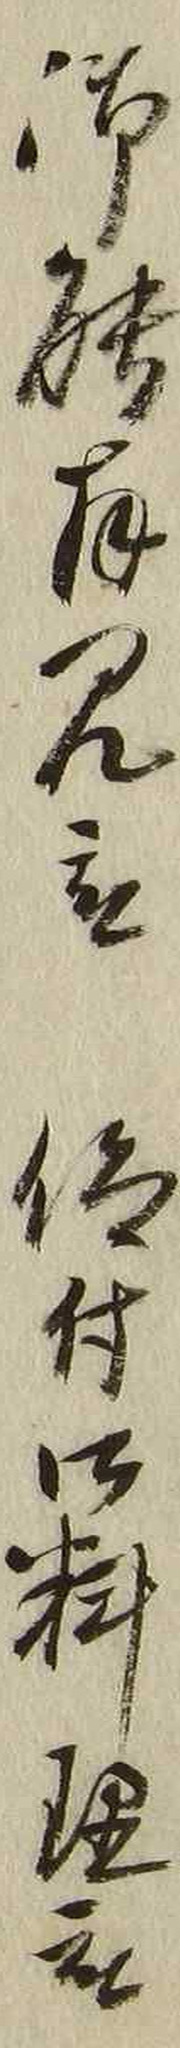御能拝見被仰付御料理被
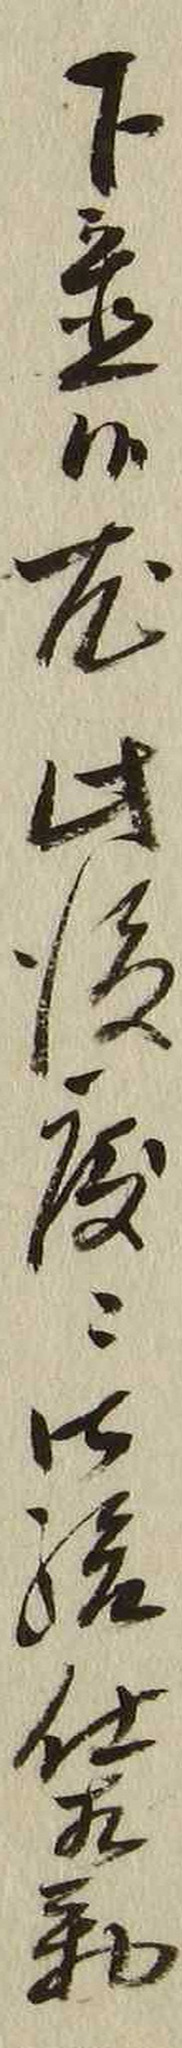下置候尤此後度々御給仕相勤
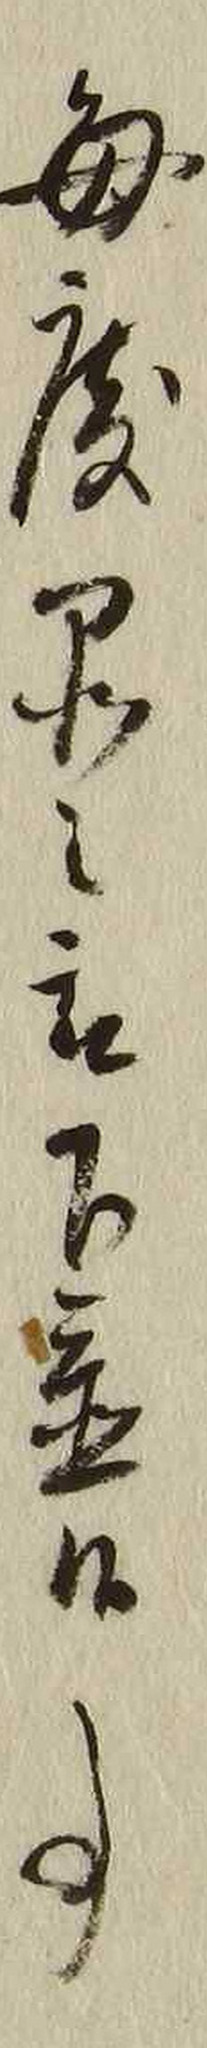毎度品々被下置候事
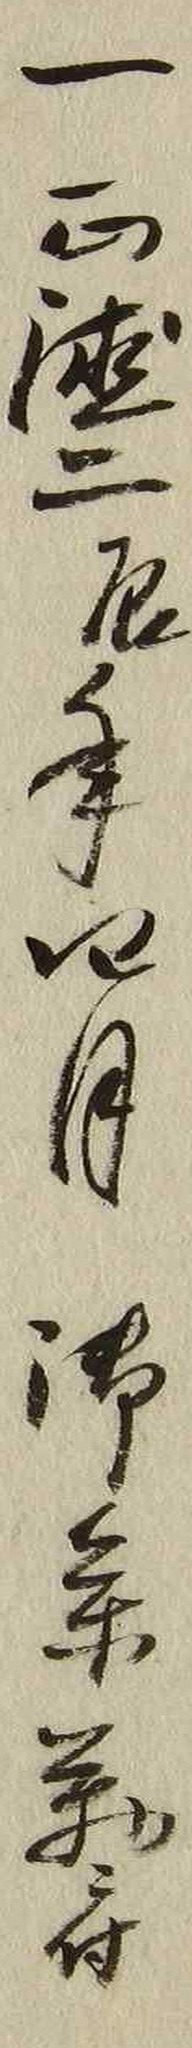一正徳二辰年四月御参勤ニ付
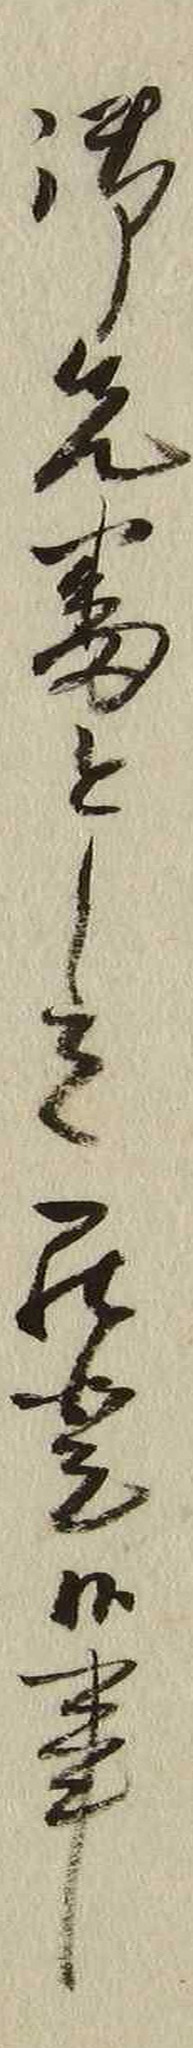御先番として罷登候事
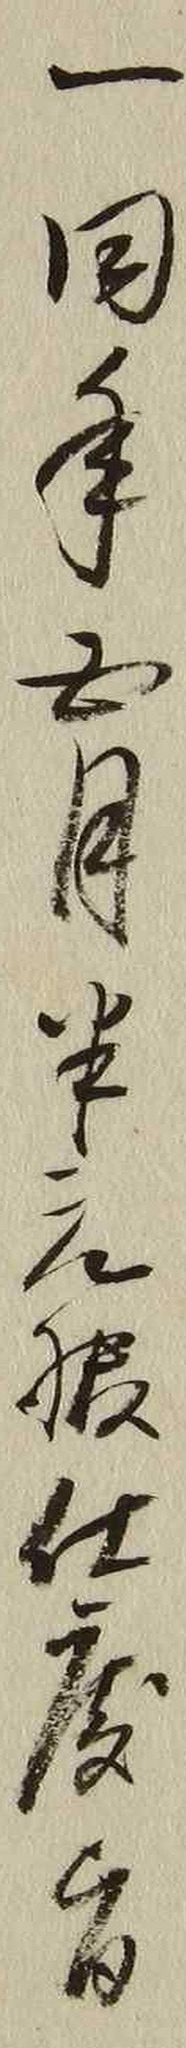一同年五月半元服仕度旨
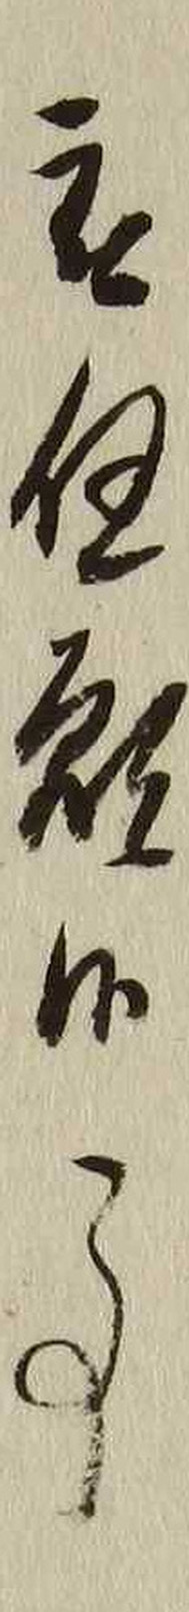被任願候事
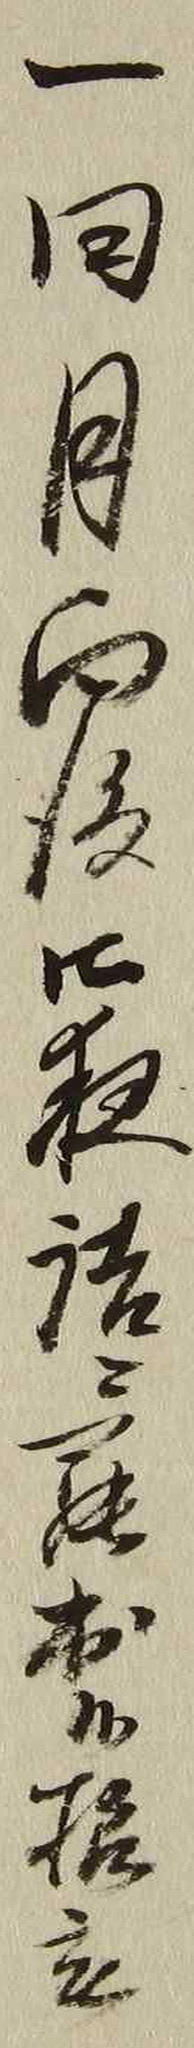一同月向後御夜詰ニ罷出候様被
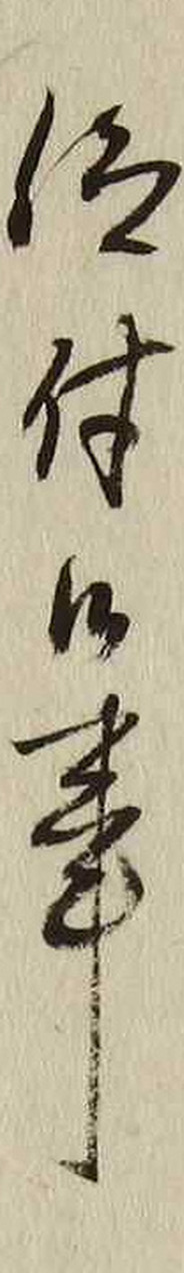仰付候事
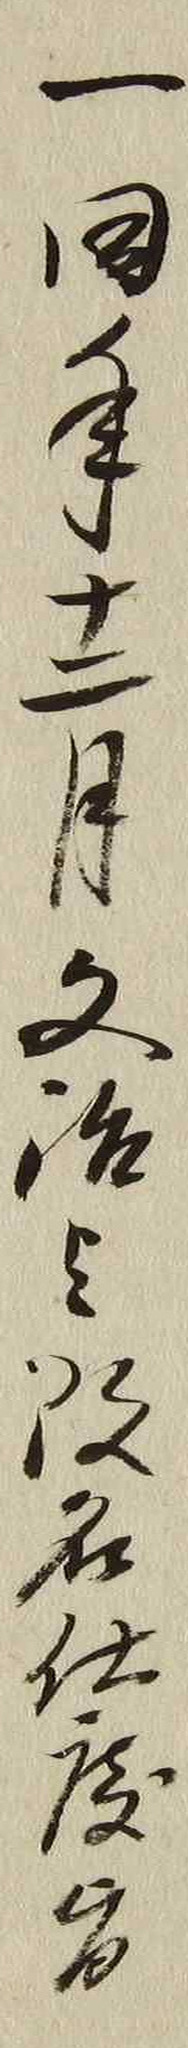一同年十二月文治与改名仕度旨
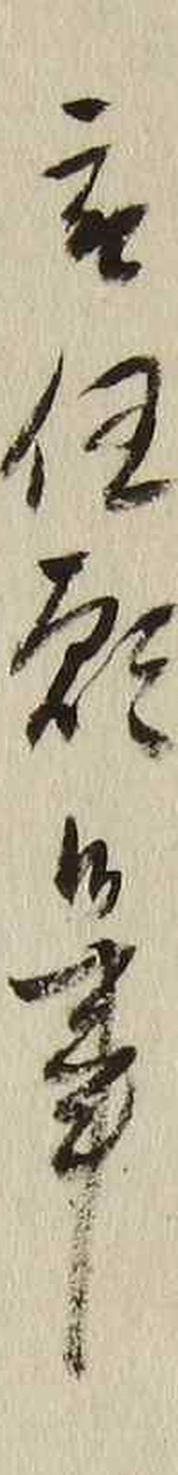被任願候事
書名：諸士系譜　巻之355　す之部5
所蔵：会津若松市立会津図書館
